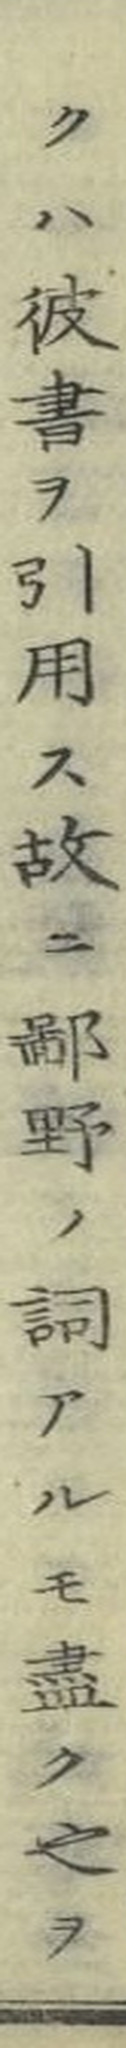クハ彼書ヲ引用ス故ニ鄙野ノ詞アルモ盡ク之ヲ
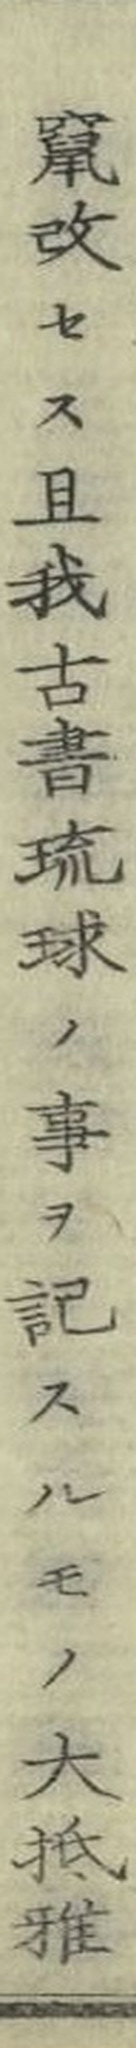竄改セス且我古書琉球ノ事ヲ記スルモノ大抵雅
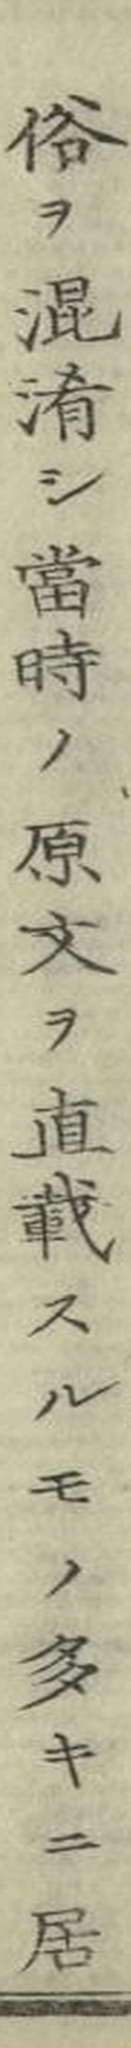俗ヲ混淆シ當時ノ原文ヲ直載スルモノ多キニ居
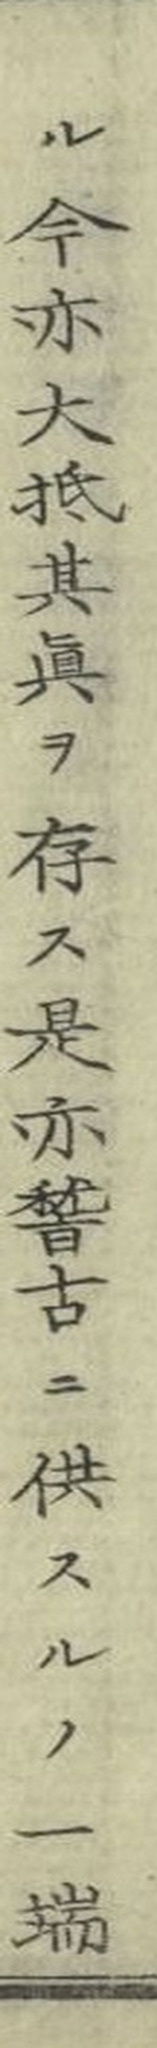ル今亦大抵其眞ヲ存ス是亦稽古ニ供スルノ一端
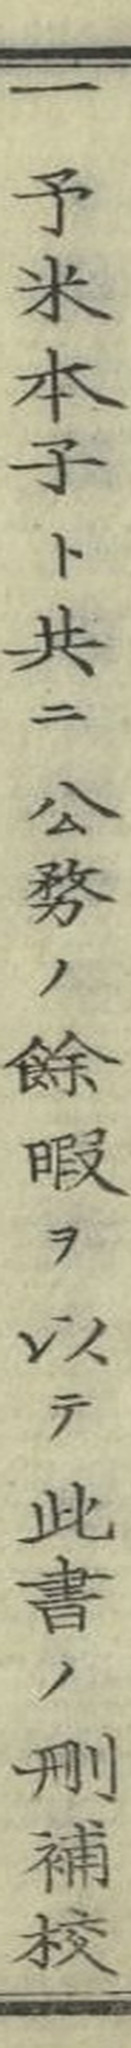一予米本子ト共ニ公務ノ餘暇ヲ以テ此書ノ刪補校
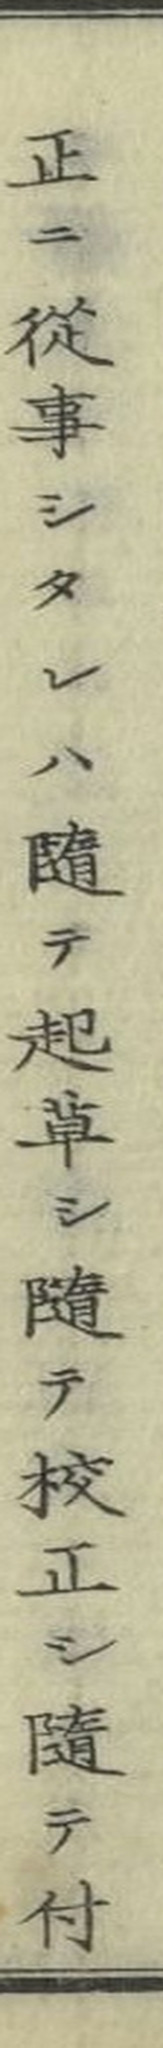正ニ從事シタルハ随テ起草シ随テ校正シ隨テ付
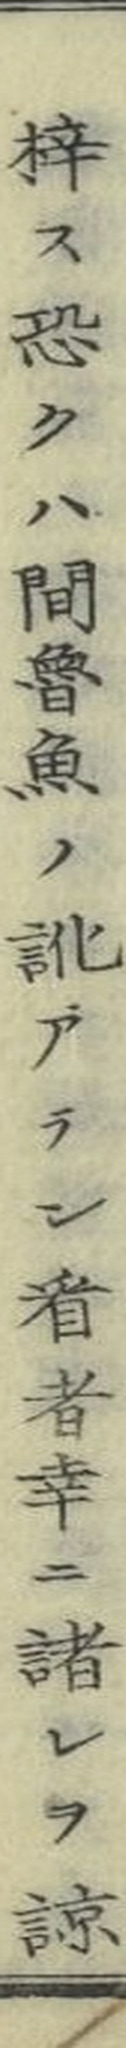梓ス恐クハ間魯魚ノ訛アラン者幸ニ諸レヲ諒
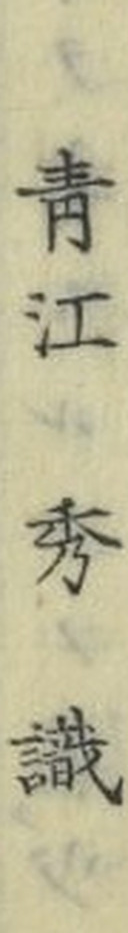青江秀識
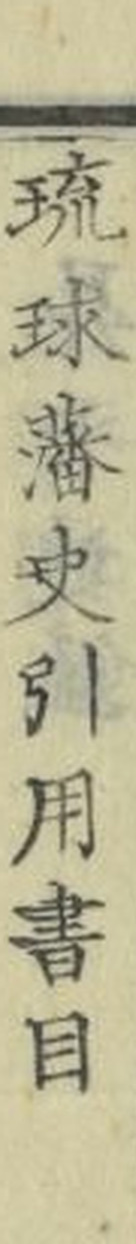琉球藩史引用書目
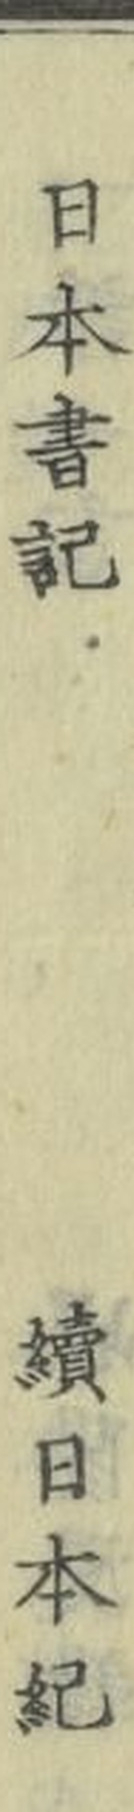日本書記續日本紀
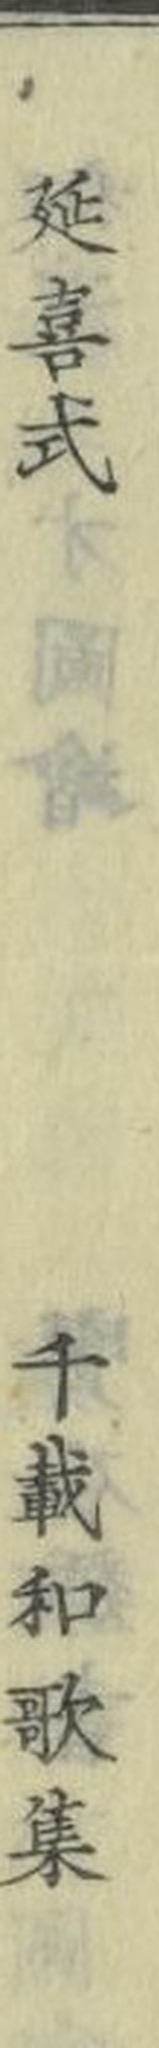延喜式千載和歌集
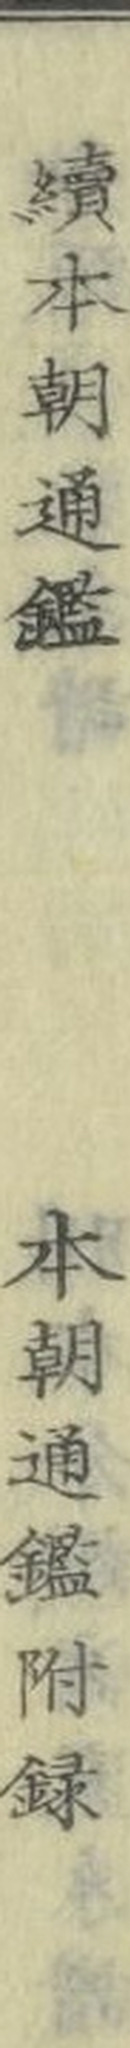續本朝通鑑本朝通鑑附録
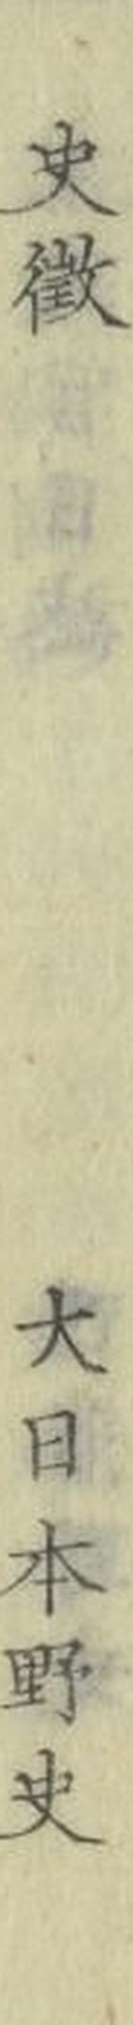史徴大日本野史
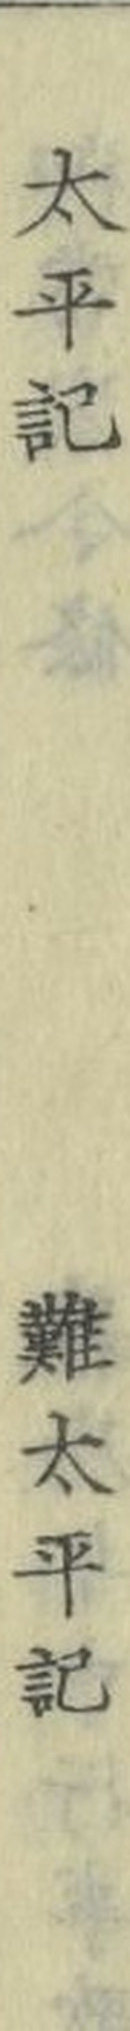太平記難太平記
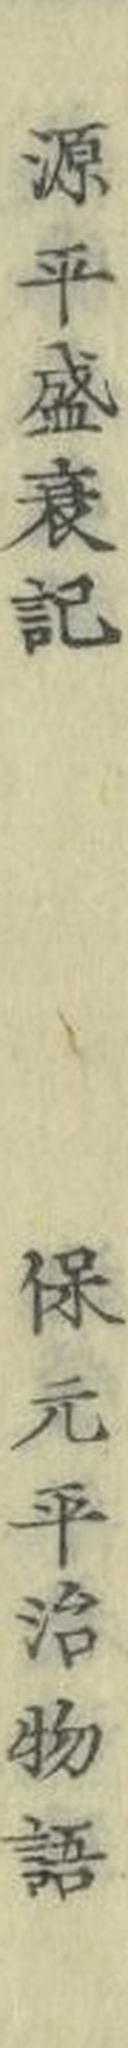源平盛衰記保元平治物語

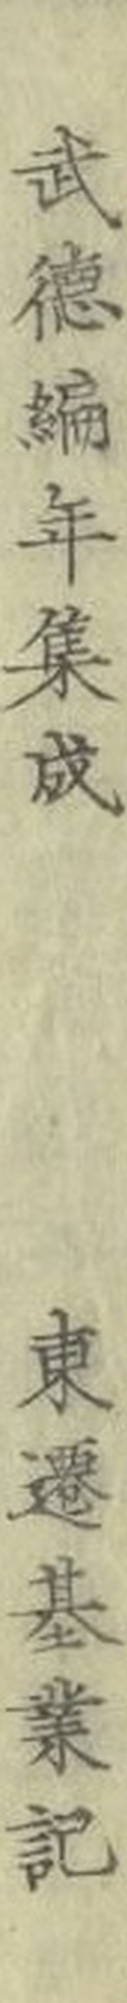武德編年集成東遷基業記
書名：琉球藩史 一之巻
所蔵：University of the Ryukyus Library
